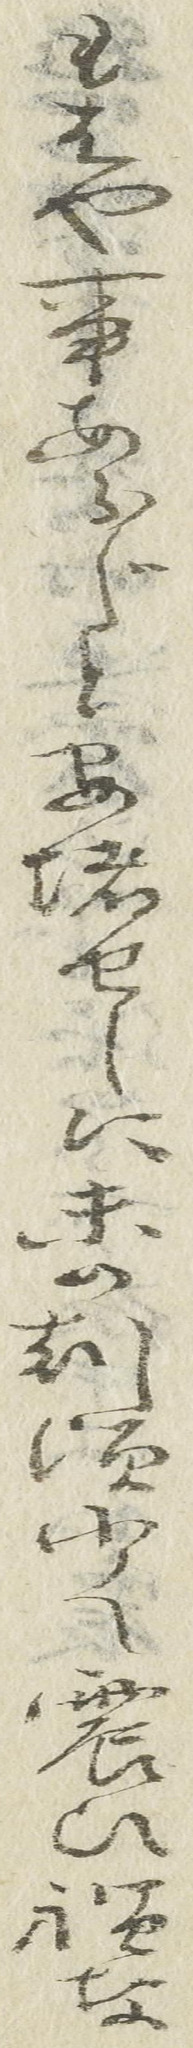もはや事あらじと安堵セしに未の刻頃少し震ひ程な
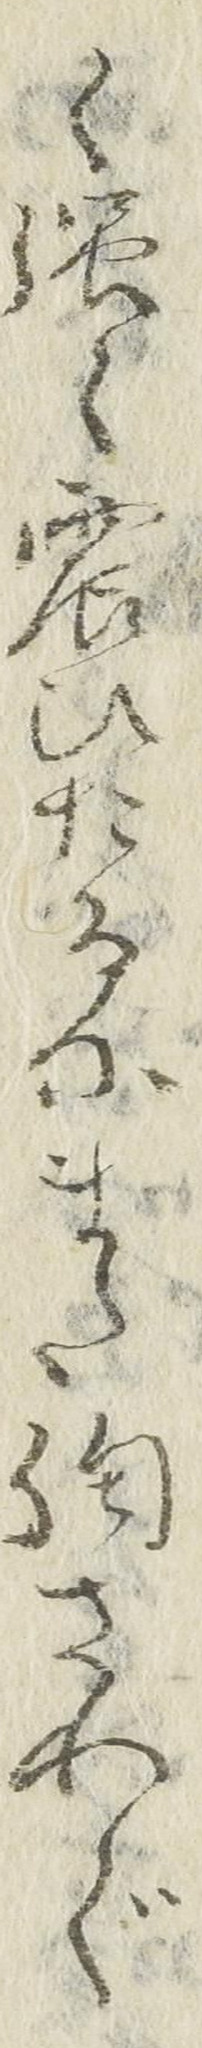く強く震ひたるにまた胸さわぐ
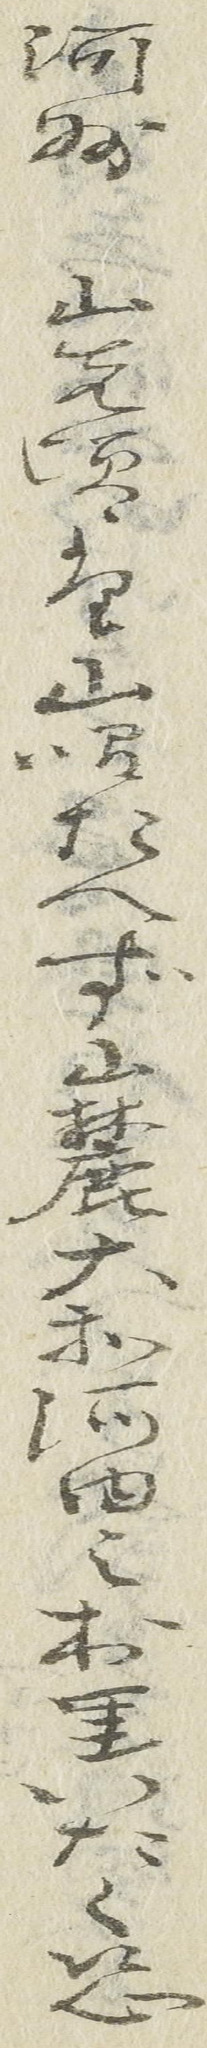河州山先頃より山鳴たへず山麓大和河内之村里いたく恐
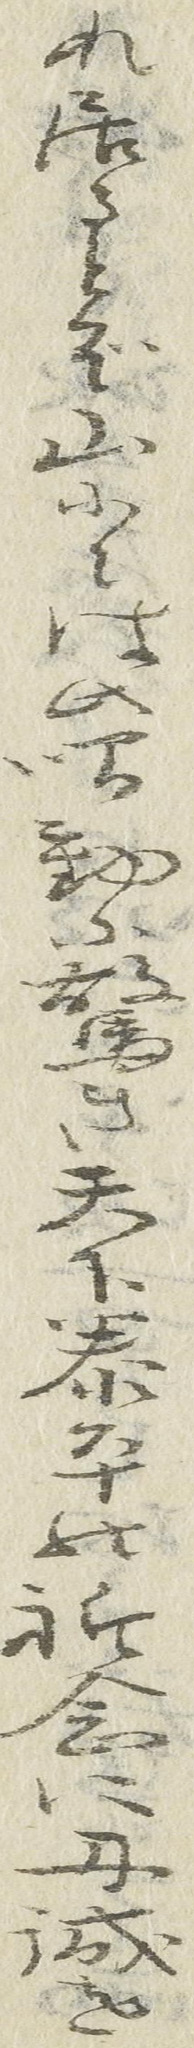れ居るとぞ山にては此鳴動に驚き天下泰平の祈念に丹誠を
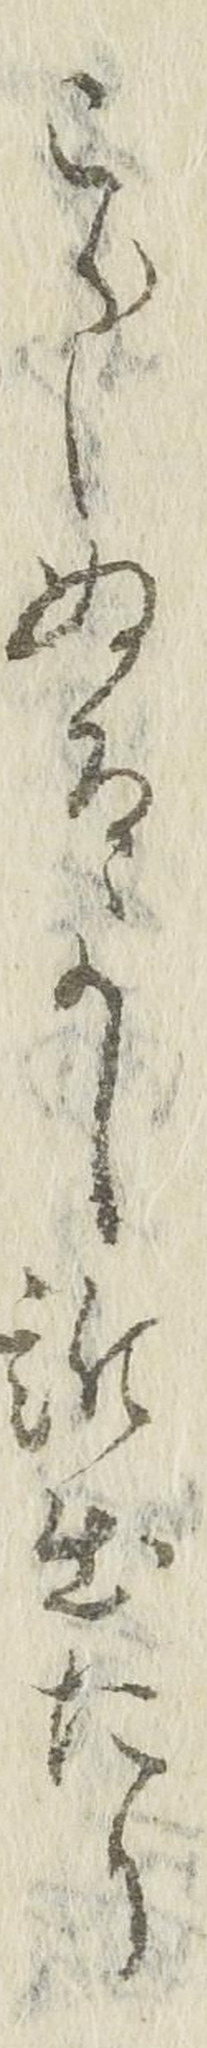こらしぬるよし訴出たり
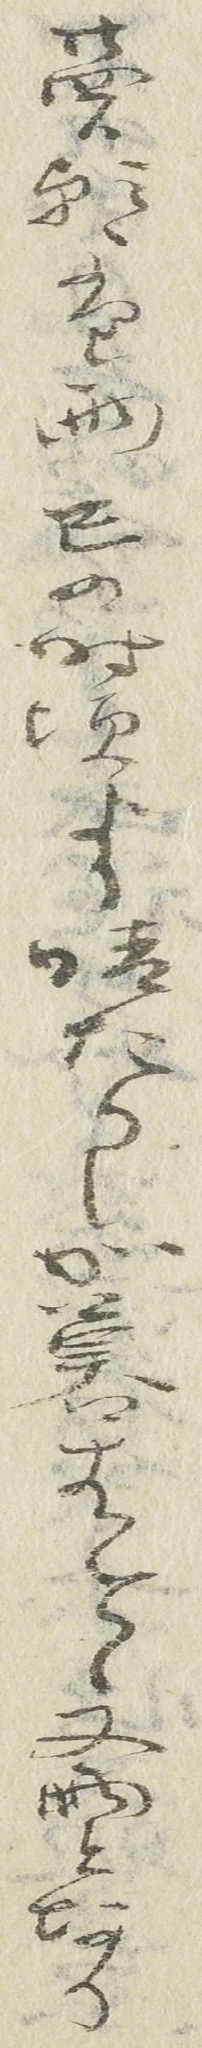廿四日朝より雨巳の時頃より晴たりしが暮はてゝ又雨となり
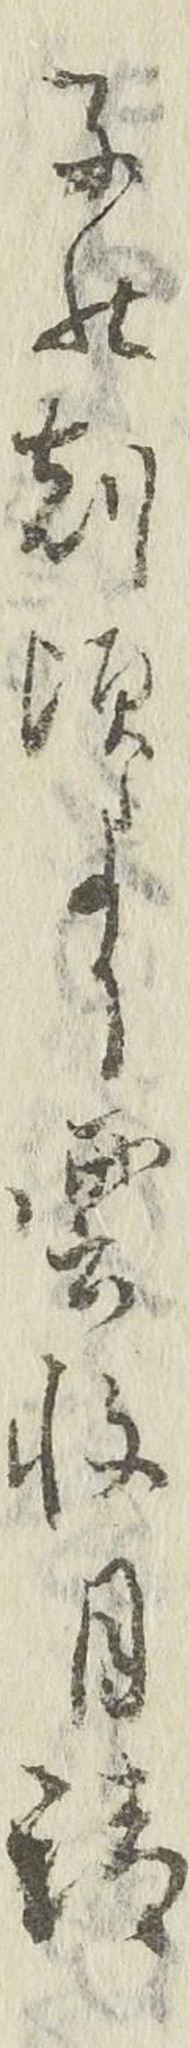子の刻頃より雲収月清

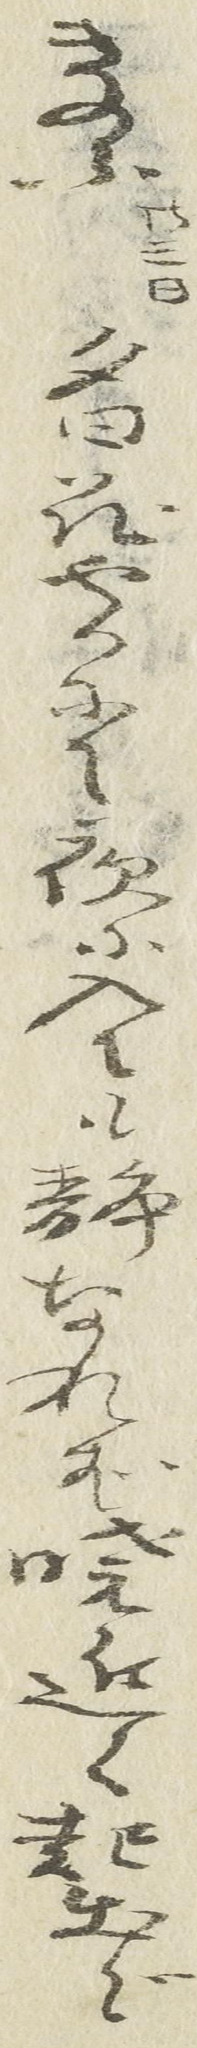きのふ廿三日夕日花やかにて夜に入ても静なれば暁近く起出で
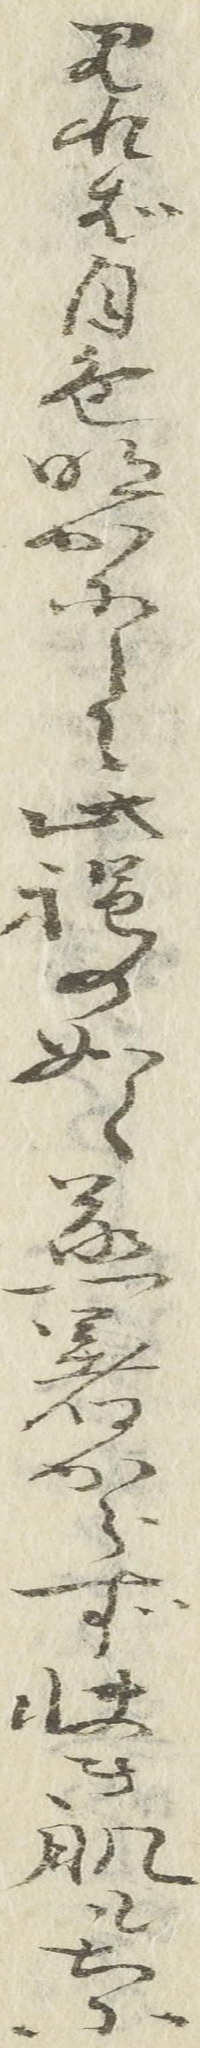見れば月色明かにして此程の如く蒸暑からず快き肌もちに
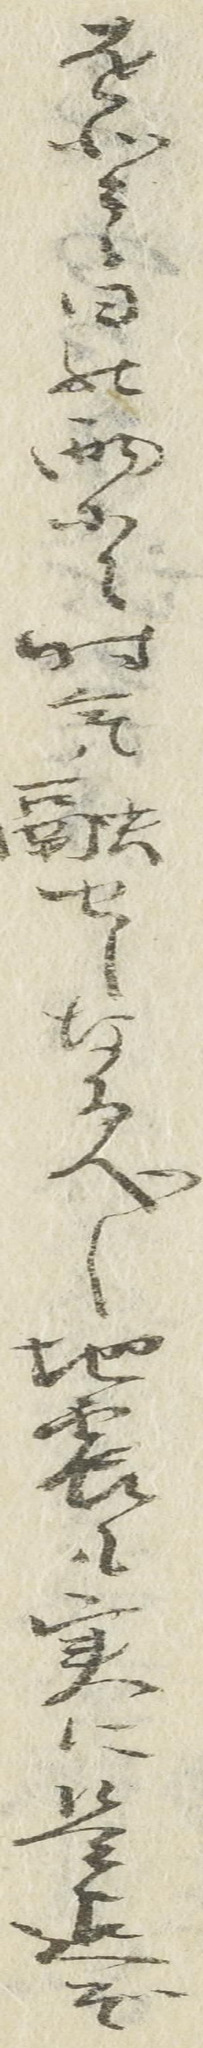をとる日の雨にて時気融せしなるべし地震も実に是迄ぞ
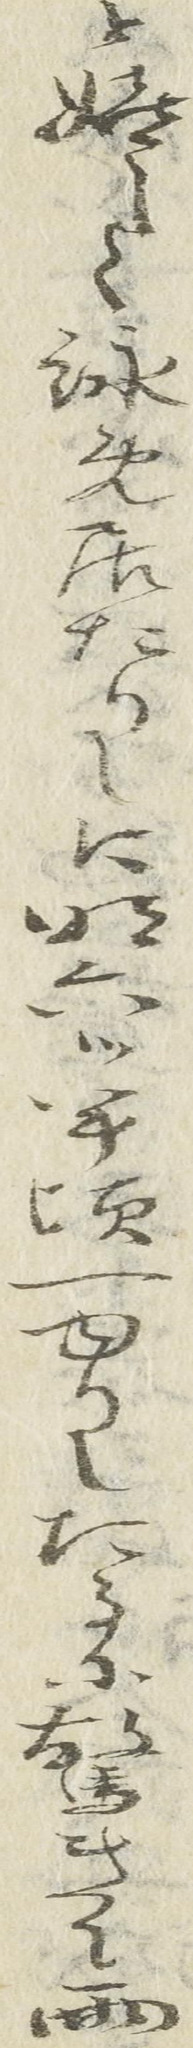と嬉しく詠め居たりしに明六ツ半頃一ゆりしたるに驚きて雨
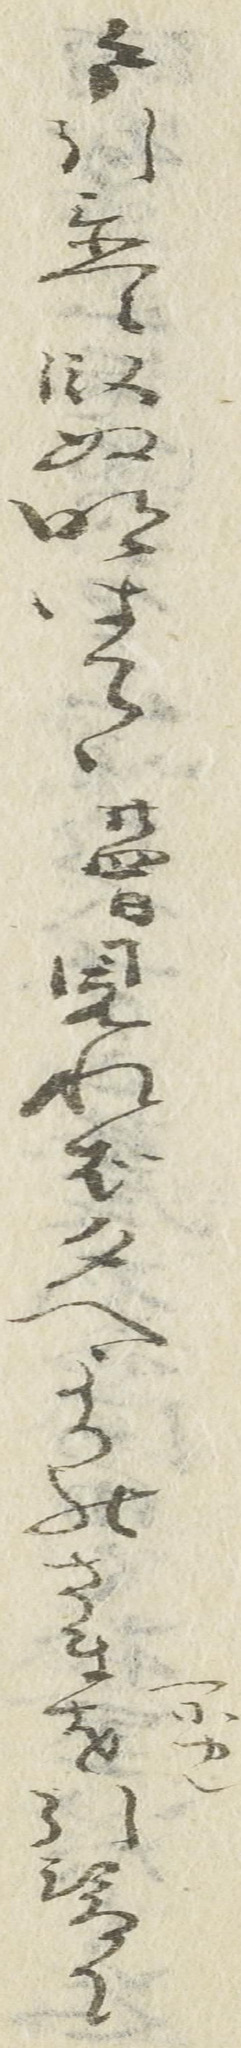戸引置し臥ぬ明はてゝ廿四日見れば夕へよりのさまを引替て
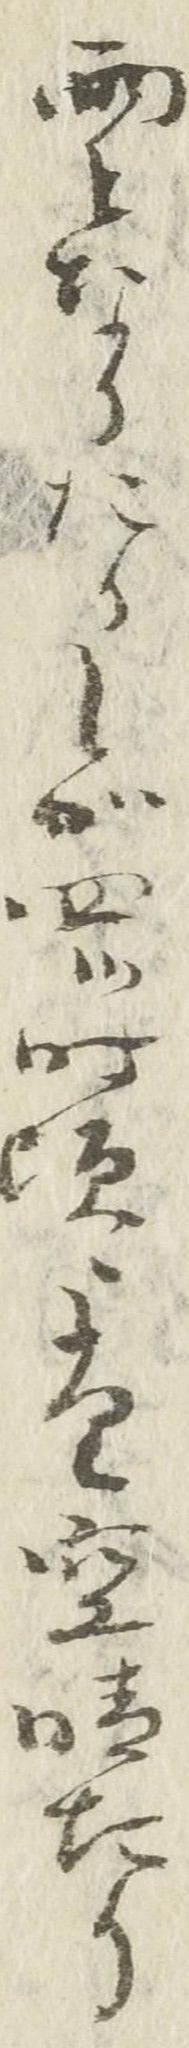雨となりたりしが四ツ時頃より空晴たり
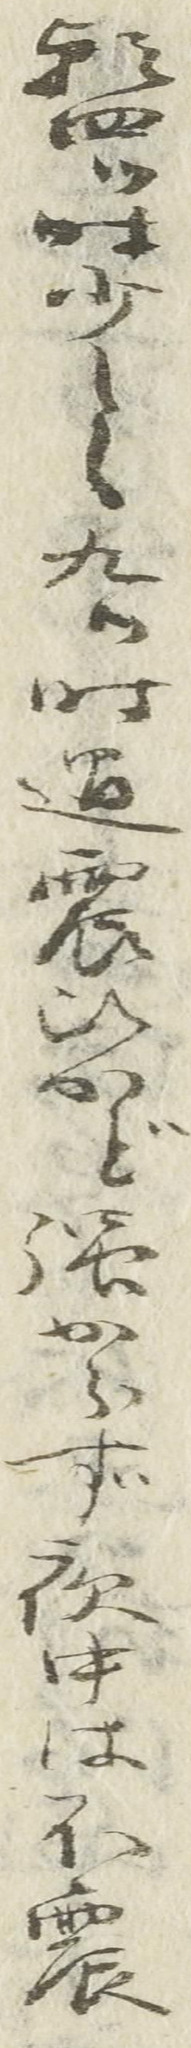朝四ツ時少して九ツ時過震ひかど強からず夜中は不震
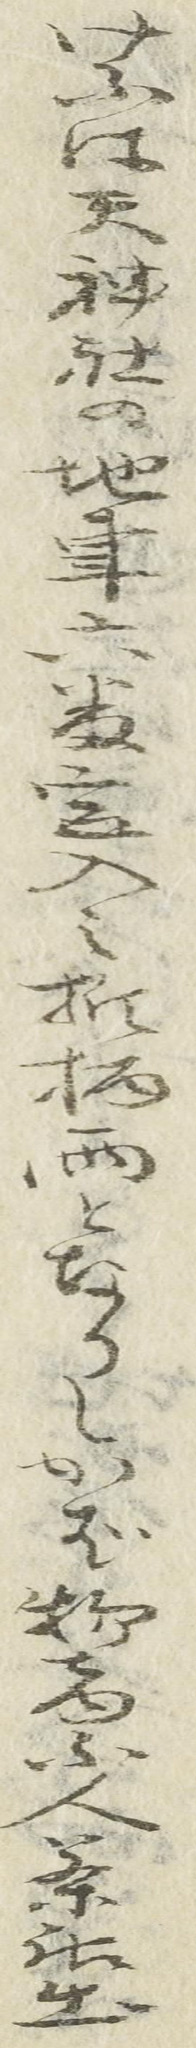けふは天神社の地事六番宮入之折柄雨となりしかば物商ふ人茶店出
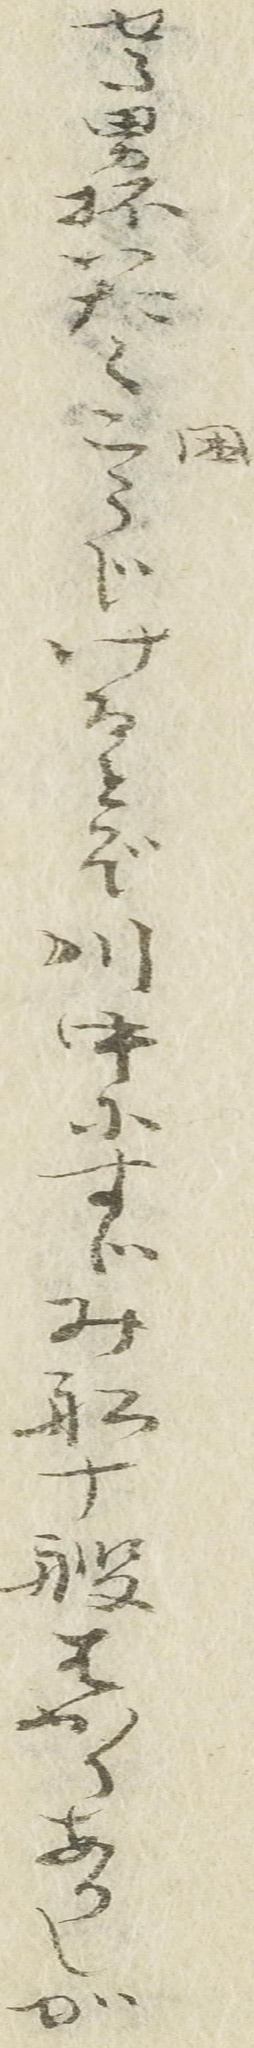せる男抔いたくこうじけるとぞ川中にすゞみ船十艘はかりありしが
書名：地震前兆集　全
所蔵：東京大学地震研究所図書室 Earthquake Research Institute Library, The University of Tokyo, JAPAN
